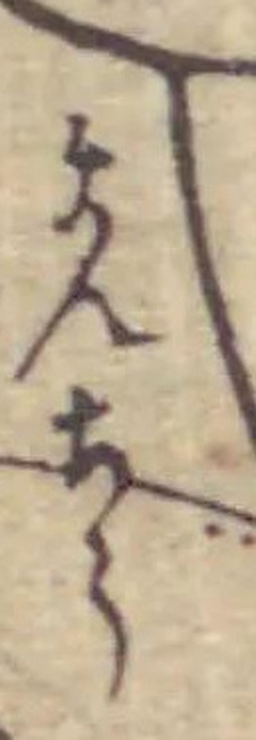まんちう
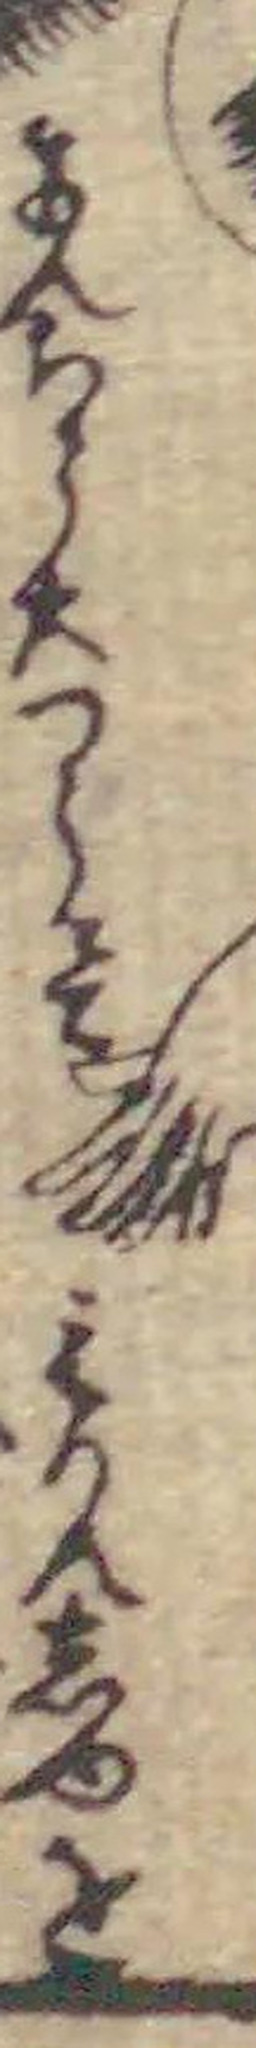まんちう大つうにてみりんしゆを
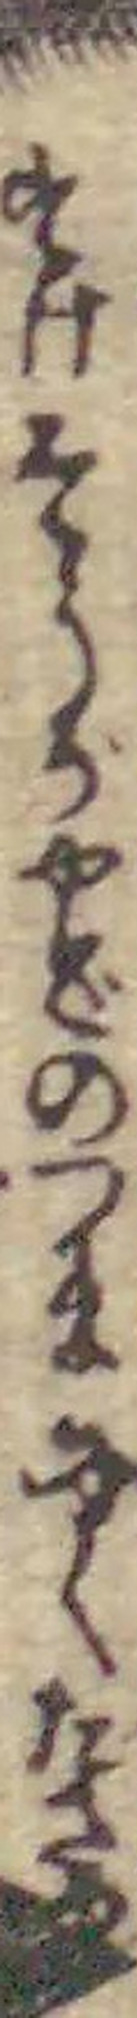すけそうがやどのつまにくださる
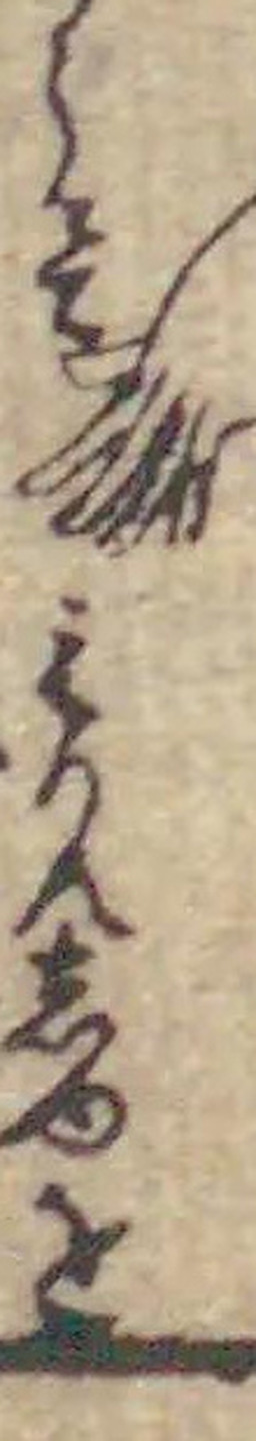みりんしゆをと
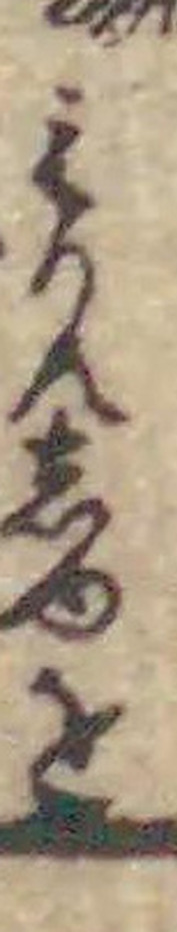みりんしゆをと
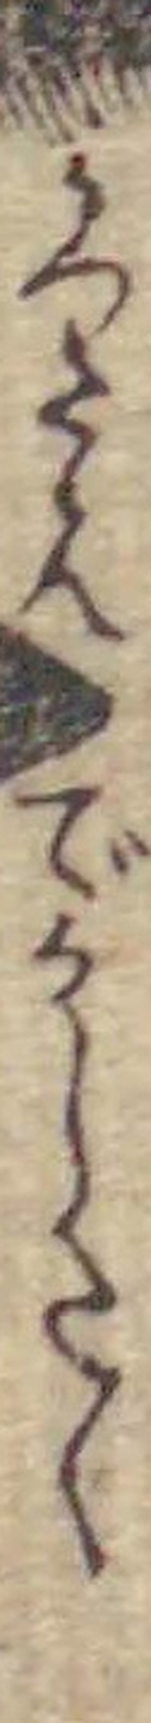うつたらんでかした〳〵
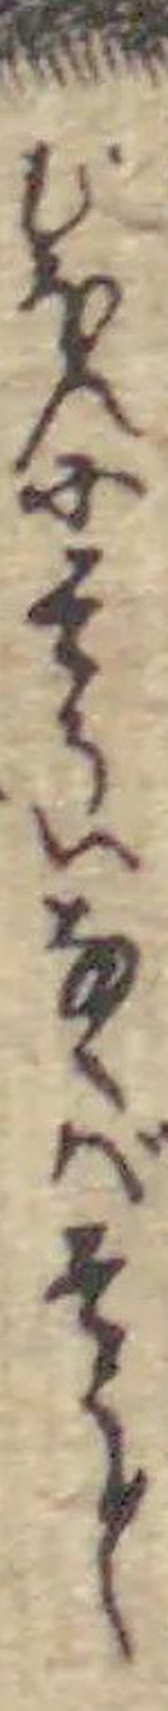むほんにそういなくばそう〳〵

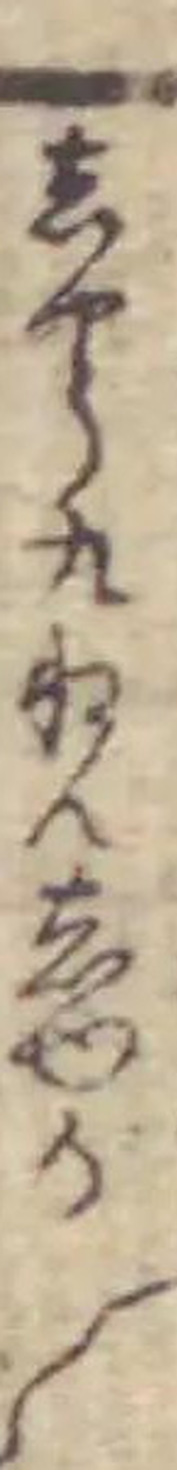しやう九ねんしゆか
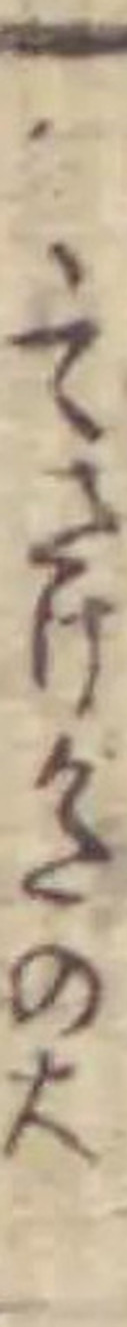てさけかたの大
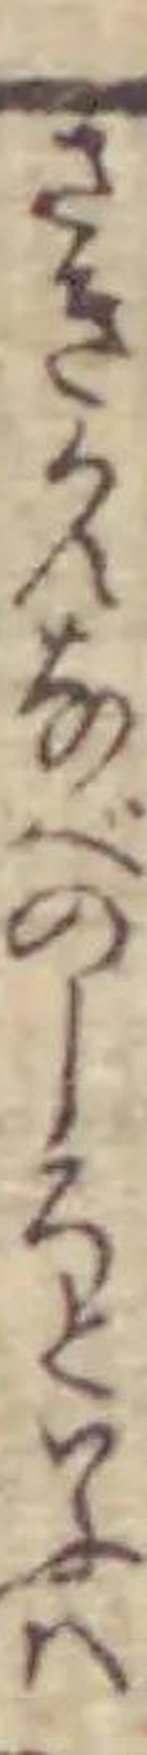さきかんなべのしろといふは
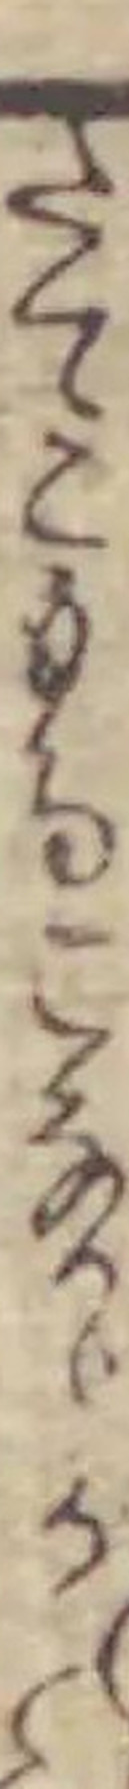たてこもるこなからが
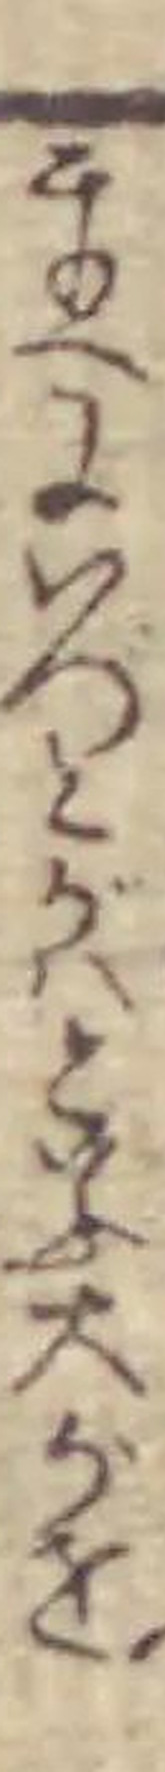まへにいづとがはといふ大がを
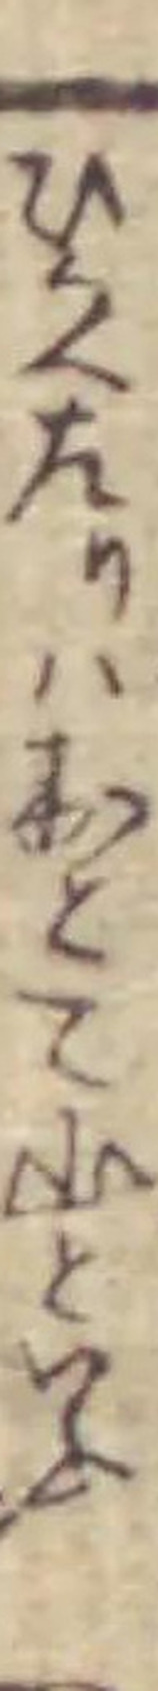ひかへ左はおとこ山といふ
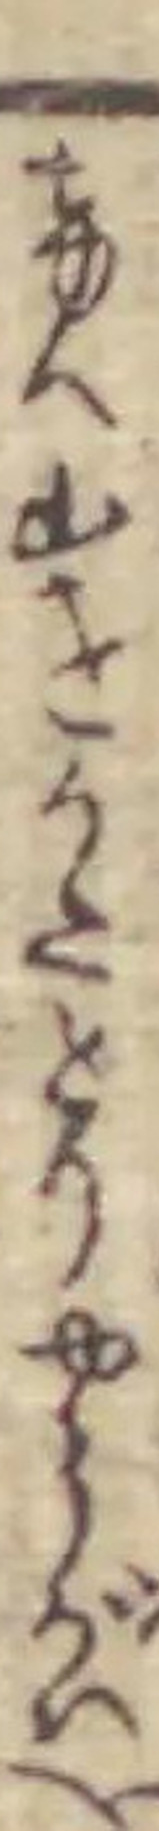けん山をかたどりやうがい
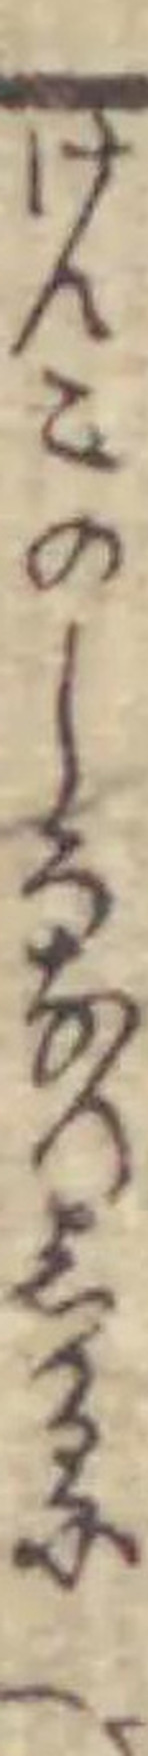けんこのしろなりしかるに
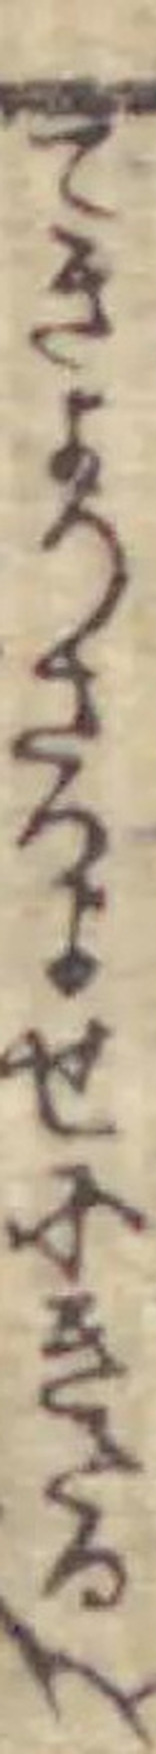てきよりさかよせにきたる
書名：餅酒腹中能同志 2巻
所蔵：国立国会図書館 National Diet Library, JAPAN
